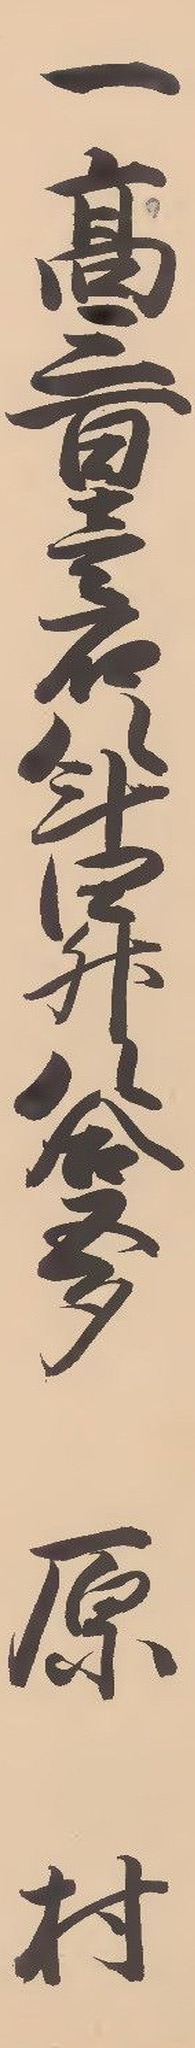一高三百壱石八斗四升八合五勺原村
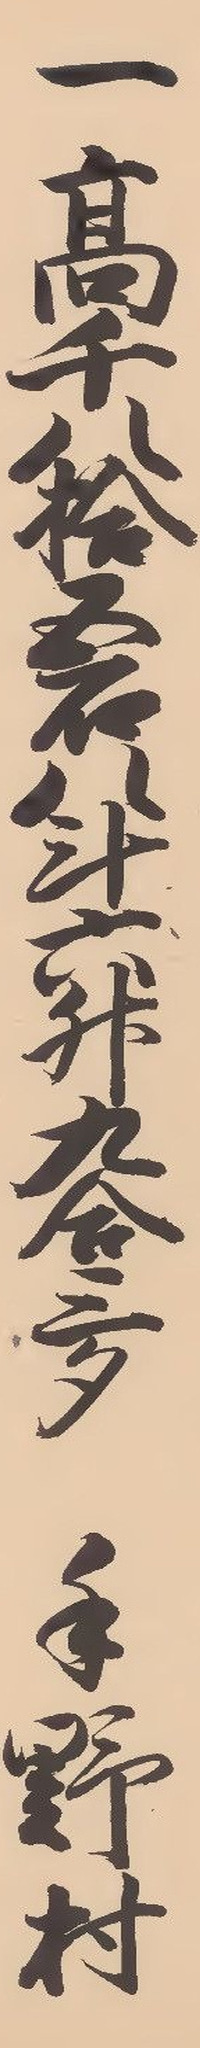一高千八拾五石八斗六升九合三勺手野村
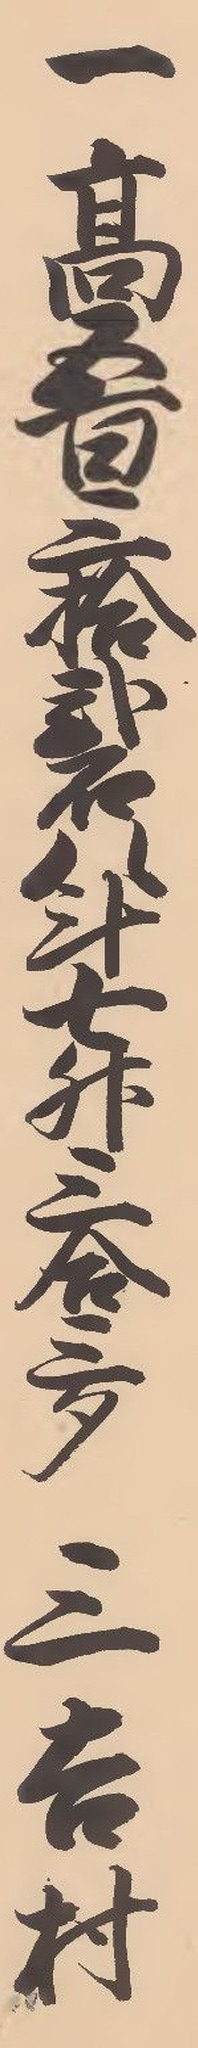一高五百三拾弐石八斗七升三合三勺三吉村

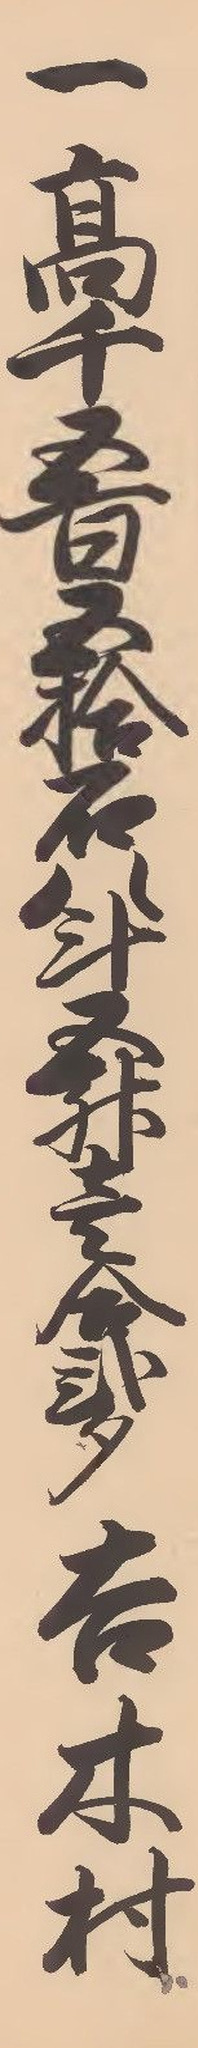一高千五百五拾石八斗五升壱合弐勺吉木村
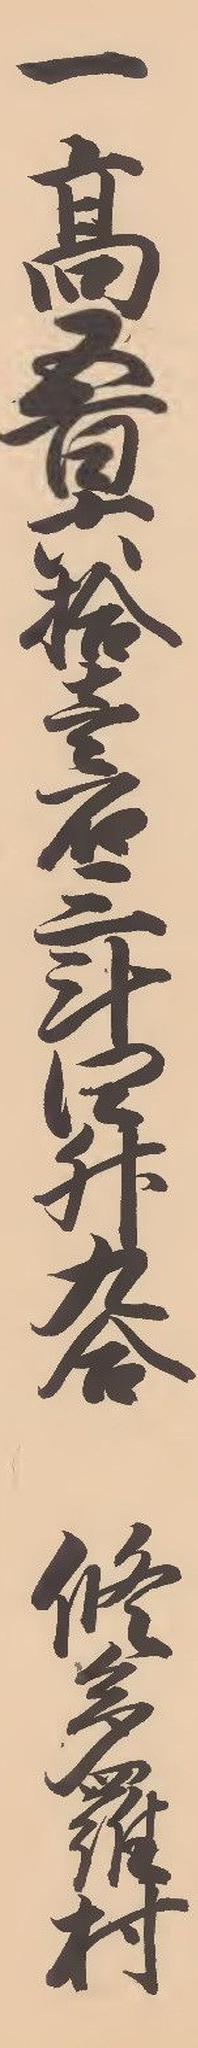一高五百六拾壱石三斗四升九合修多羅村
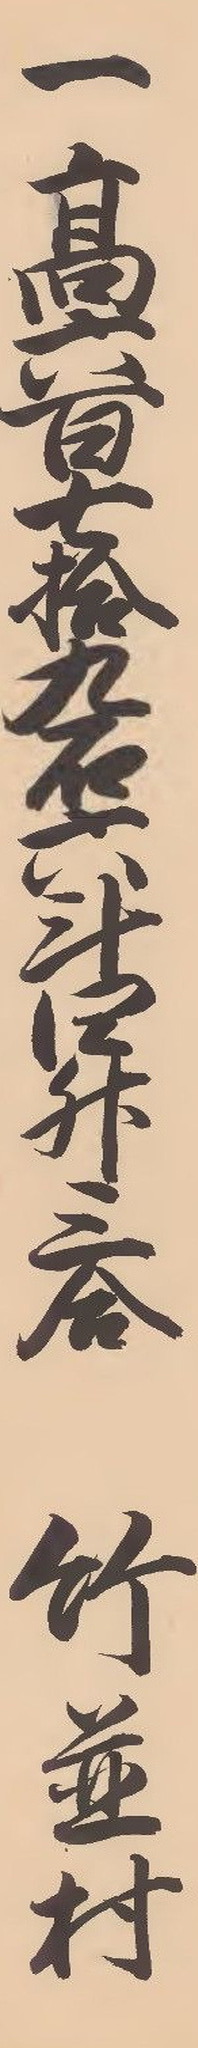一高六百七拾九石六斗四升三合竹並村
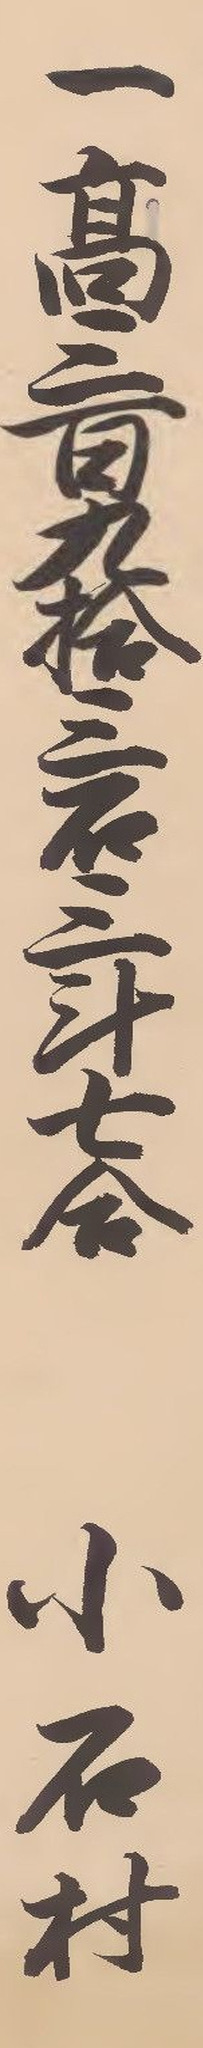一高三百九拾三石三斗七合小石村
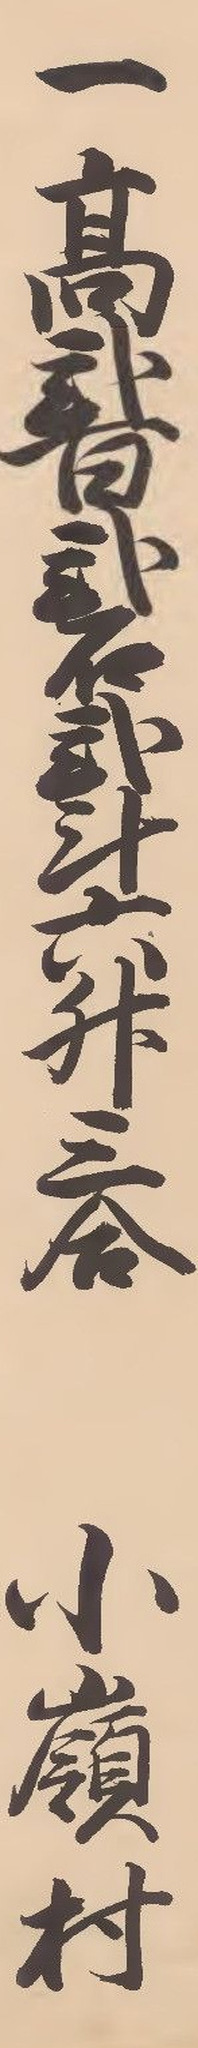一高弐百弐石弐斗六升三合小嶺村
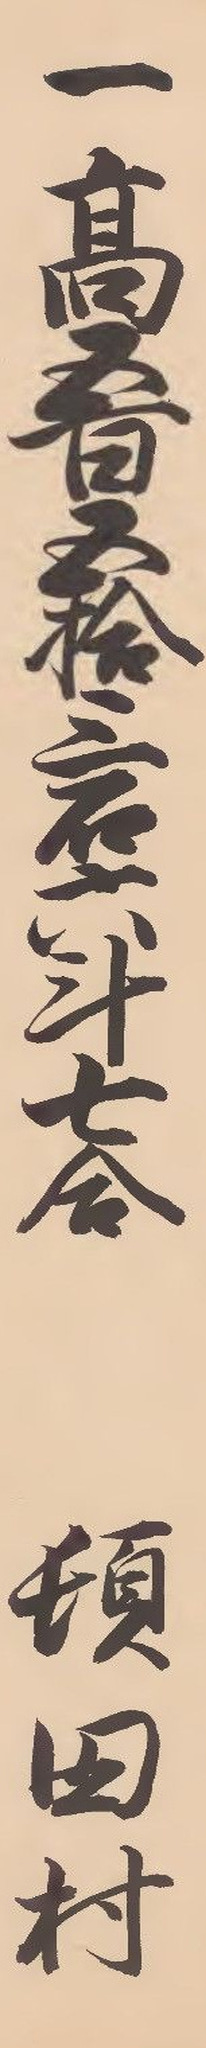一高五百五拾三石六斗七合頓田村

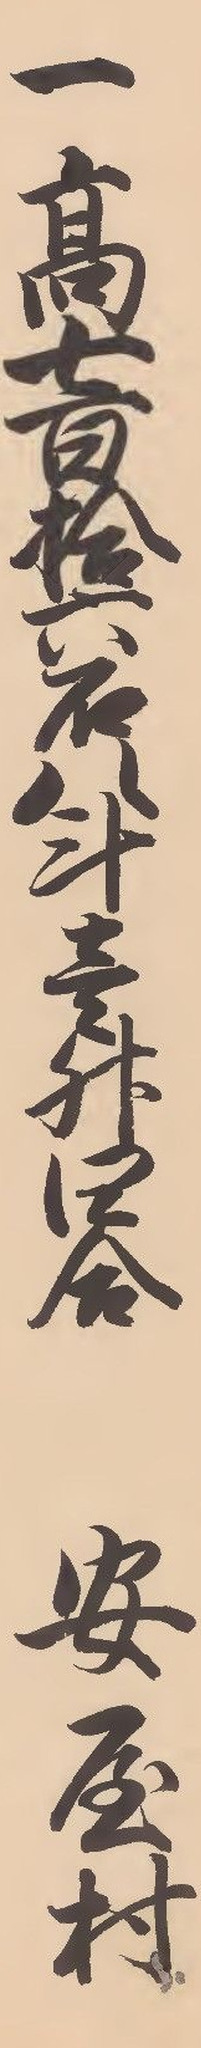一高七百拾六石八斗壱升四合安屋村
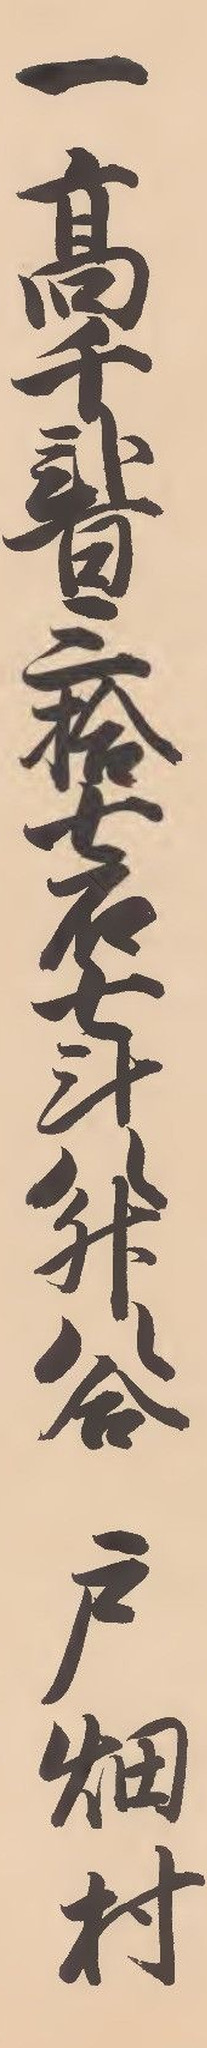一高千弐百三拾七石七斗八升八合戸畑村
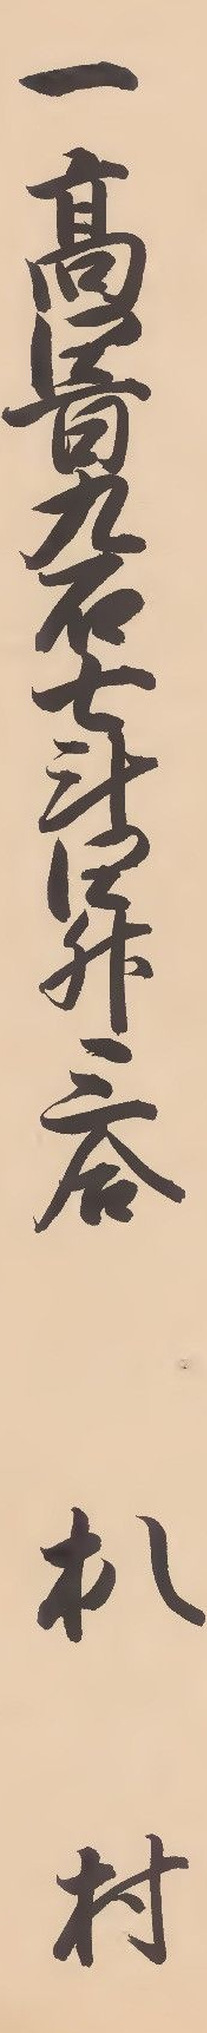一高四百九石七斗四升三合朳村
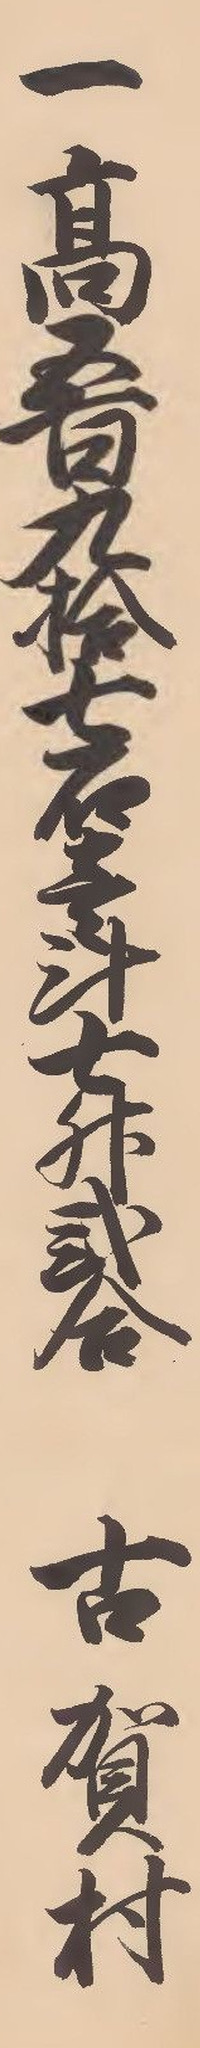一高五百九拾七石壱斗七升弐合古賀村
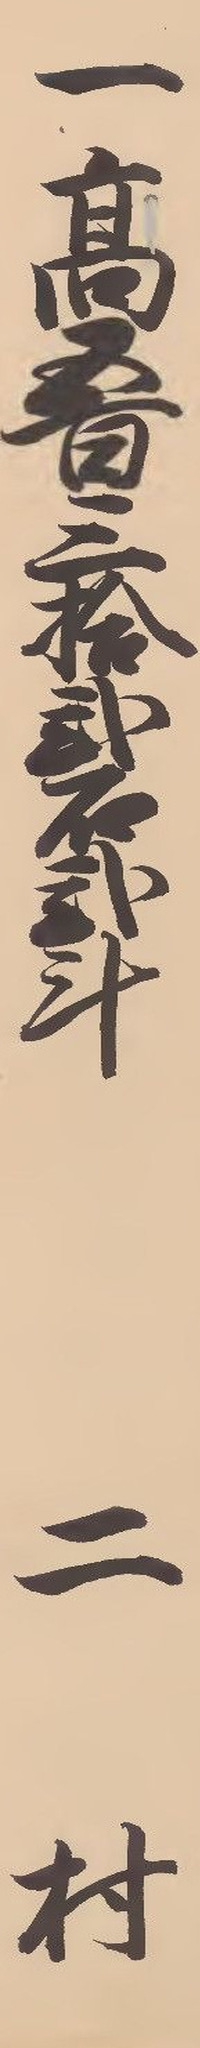一高五百三拾弐石弐斗二村
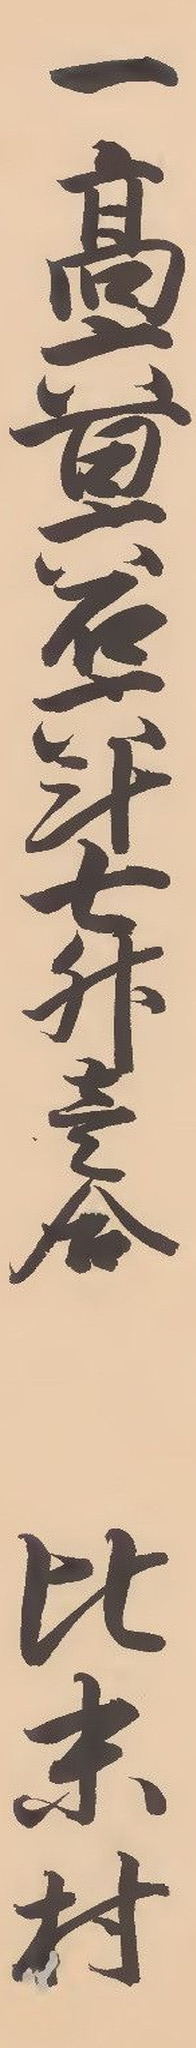一高六百六石六斗七升壱合比末村

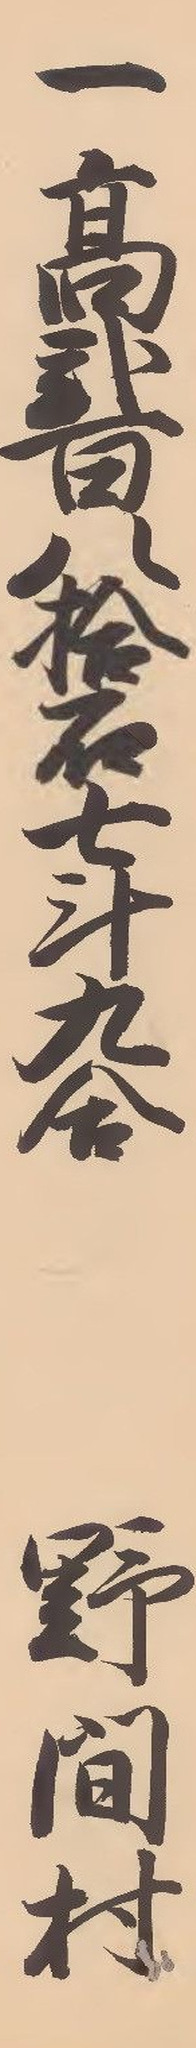一高弐百八拾石七斗九合野間村
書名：筑前国郷帳
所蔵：国立公文書館 National Archives of Japan
